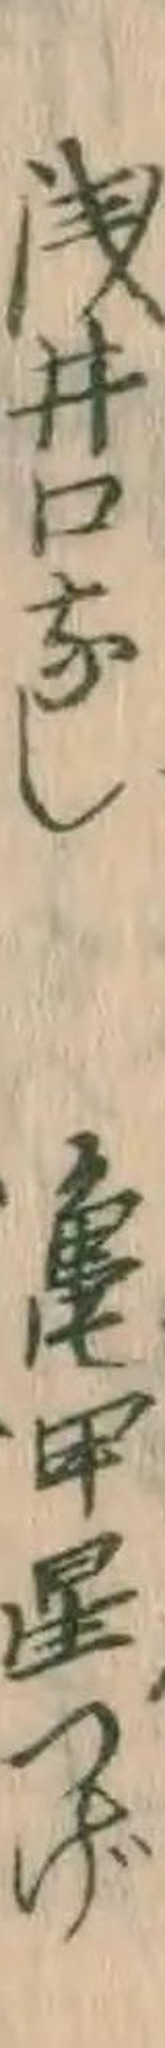浅井口なし亀甲星つげ
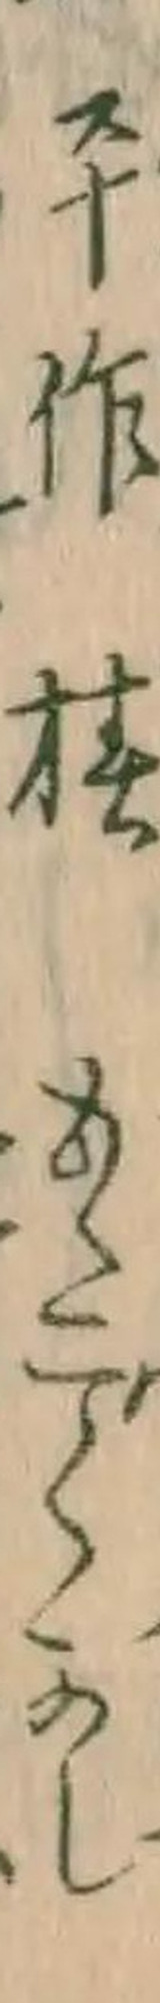平作椿もたてかし
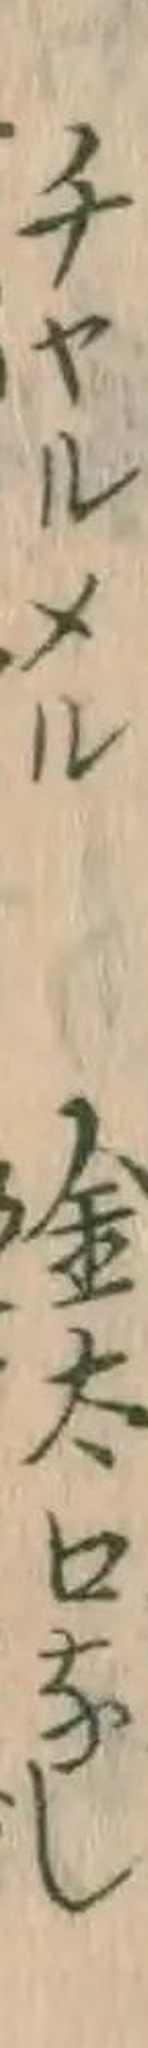チャルメル金太口なし
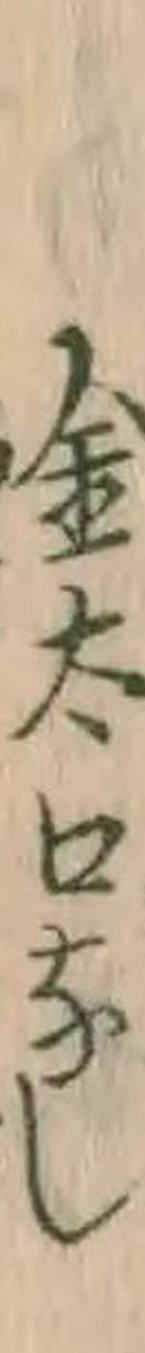荻生口なし
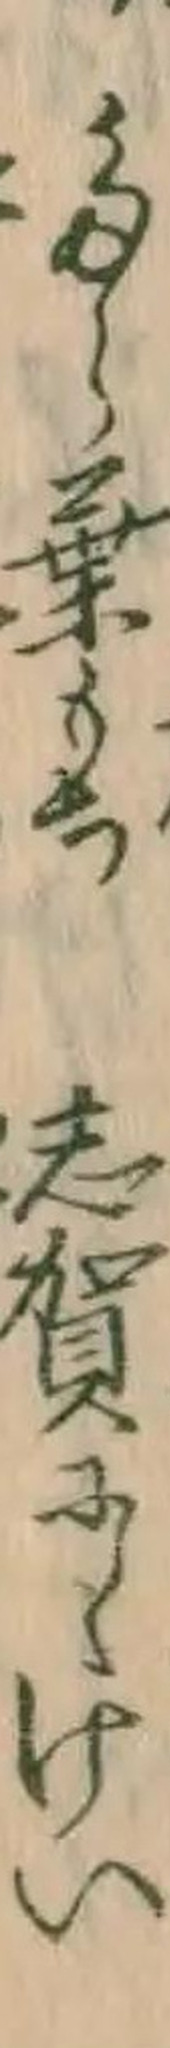たし葉もち志賀にくけい
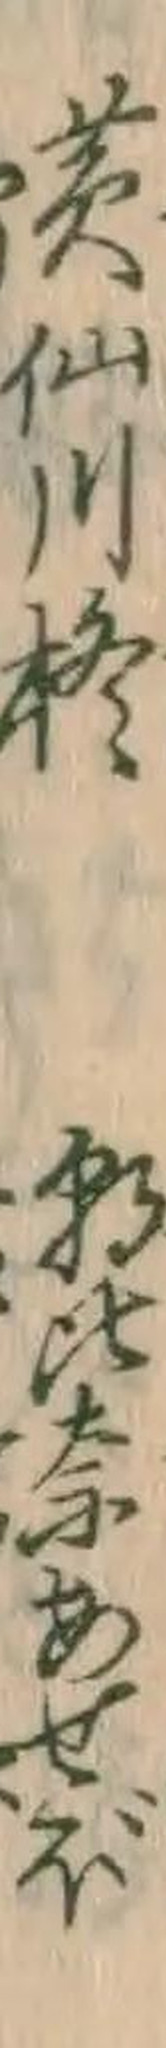黄仙川柊朝比奈あせぼ
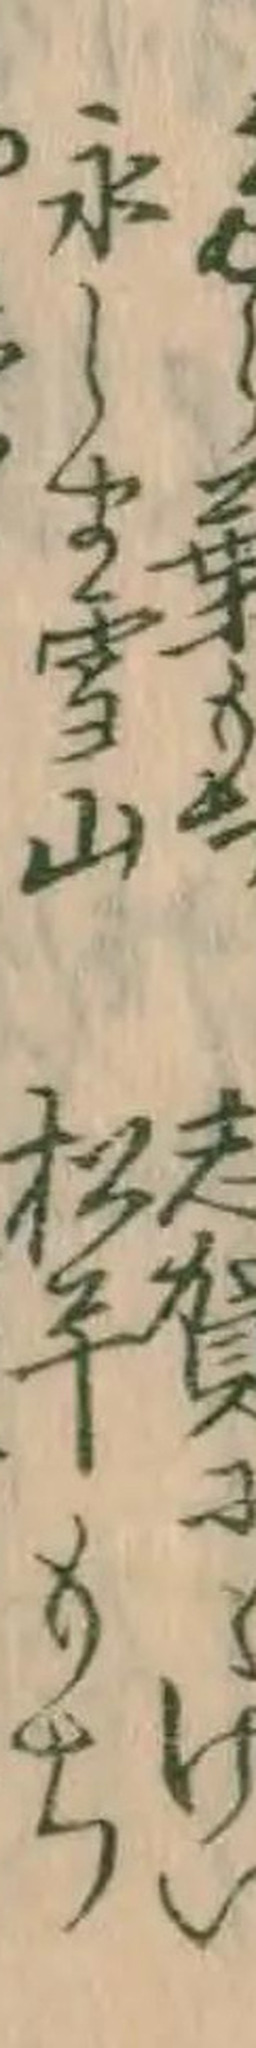永しま雪山松平もち
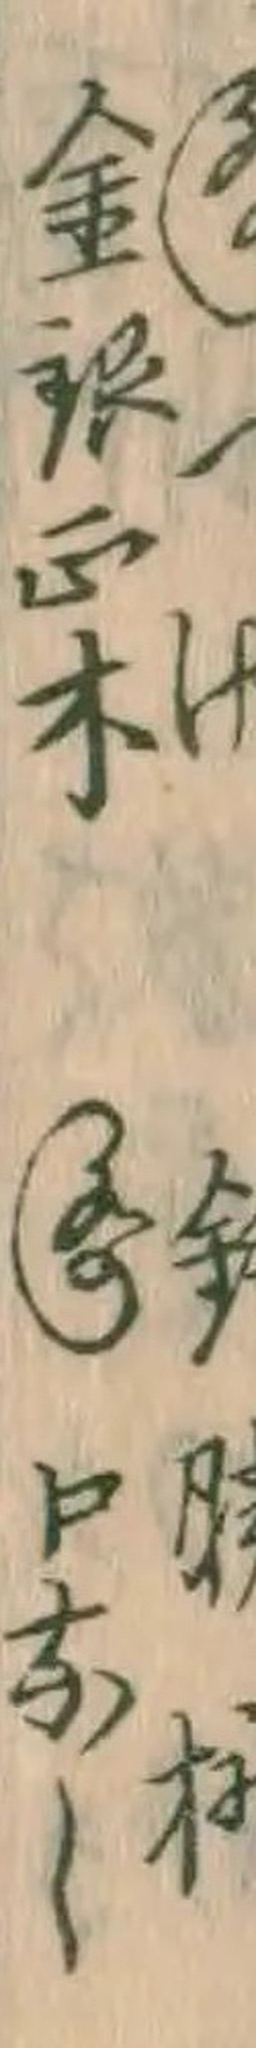金銀正木水の口なし
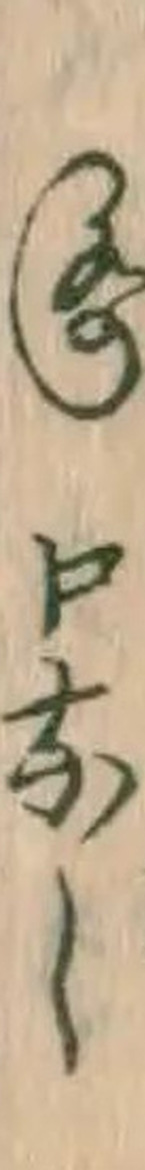荻生口なし
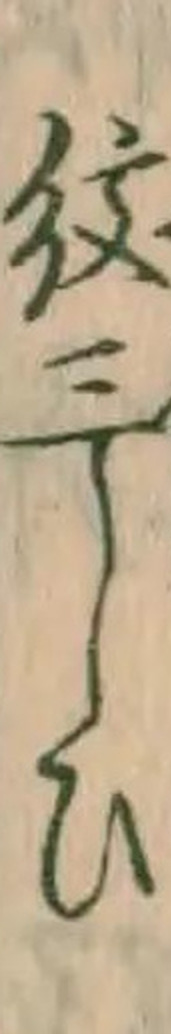紋三男しひ
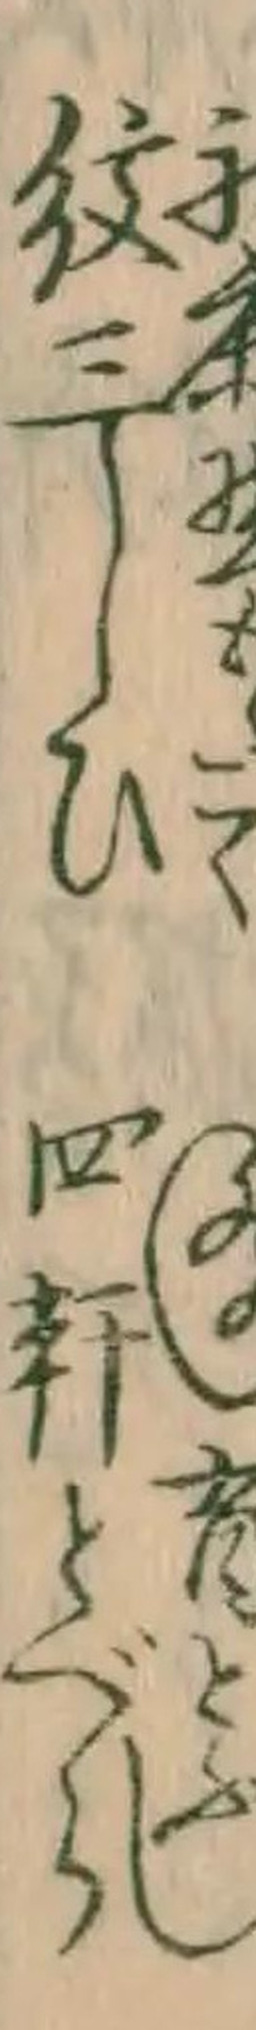紋三しひ四軒とべら
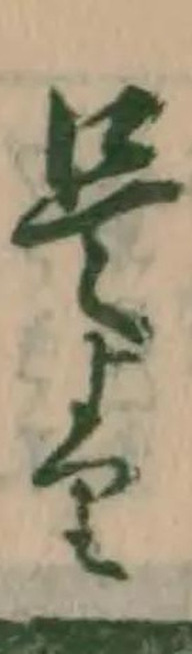是より
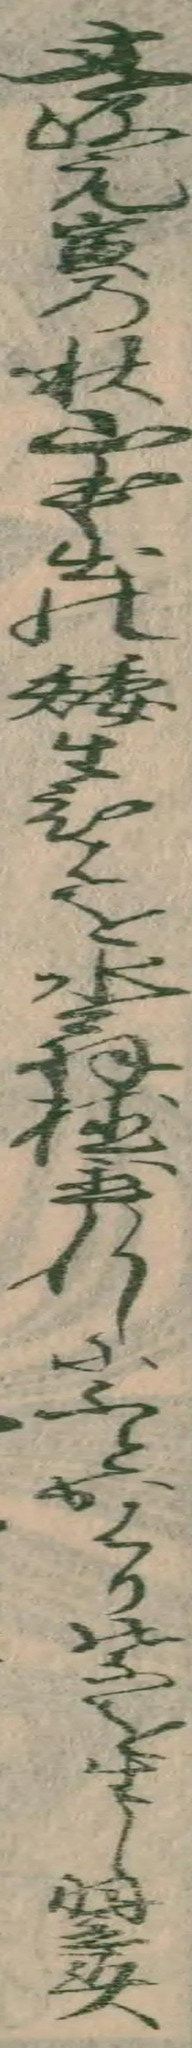文政元寅の秋山本出の矮生ひはを水翁植置し有にふとかはり葉を生し翌春
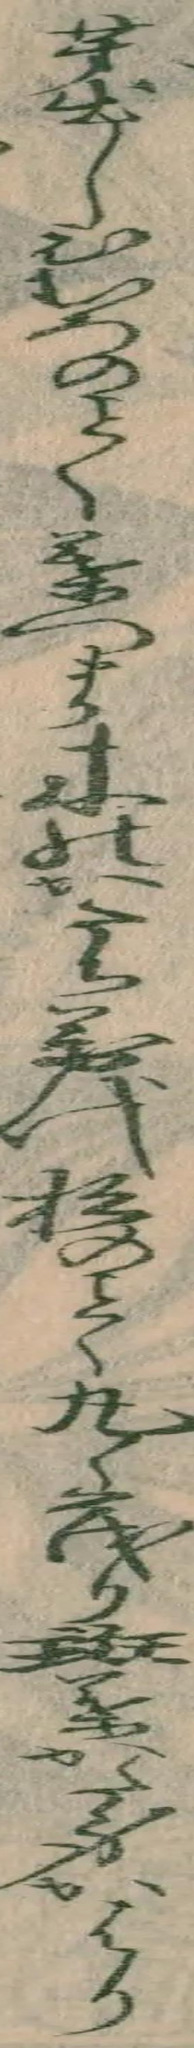芽出しひむろのことく葉つまり木のかたち万代杉のことく丸く茂り斑葉かた身かはり
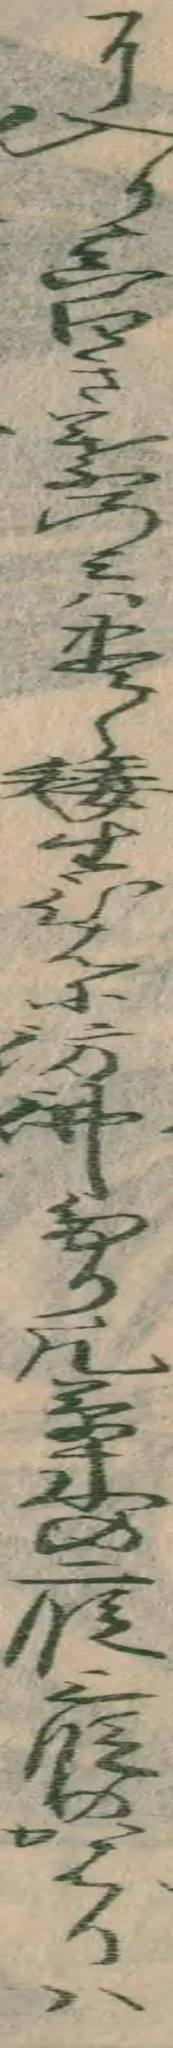に入り真白き葉かつみは尽て矮生ひはに彷彿たり凡草木の二段三段のかはりは
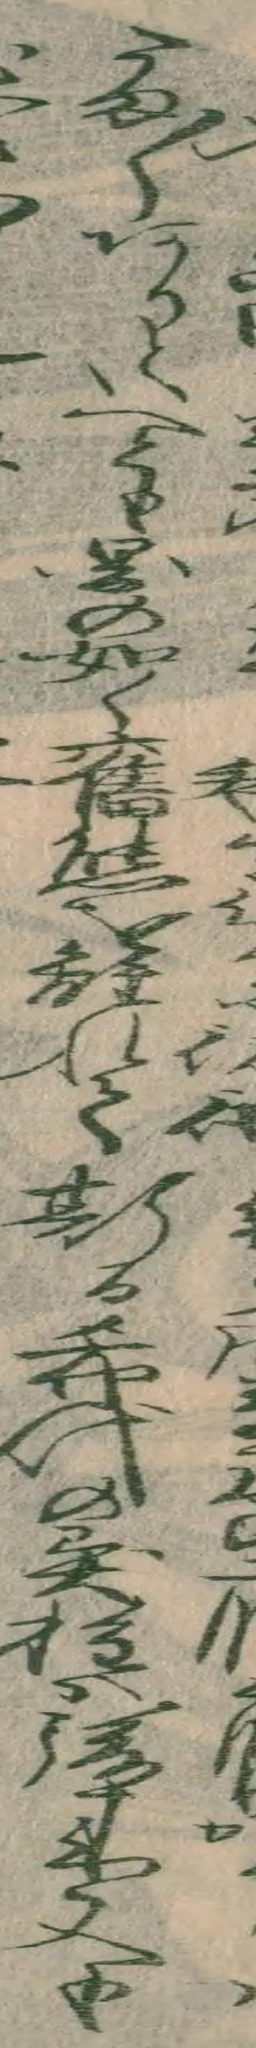たま〳〵ありといへとも図の如く旧態を離れて斯る希代の異種は後来又も
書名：草木奇品家雅見 3巻. [3]
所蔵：国立国会図書館 National Diet Library, JAPAN
